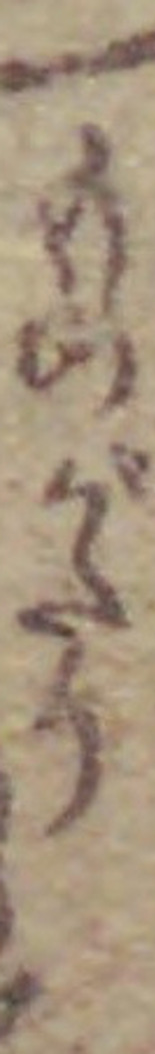ものがたりして
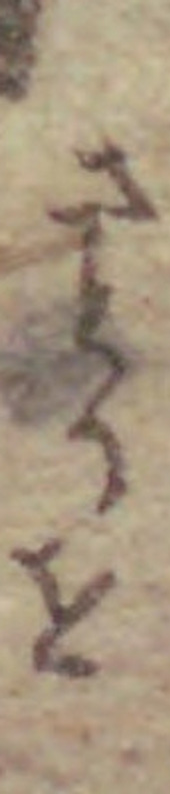さとりを
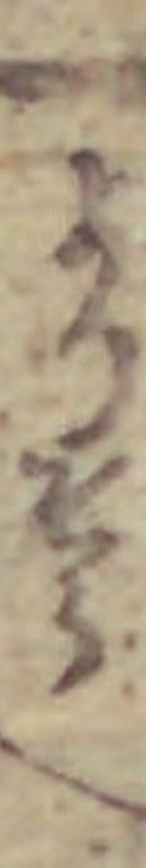よりそう
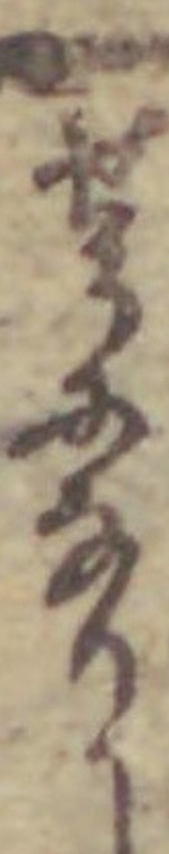せうになり
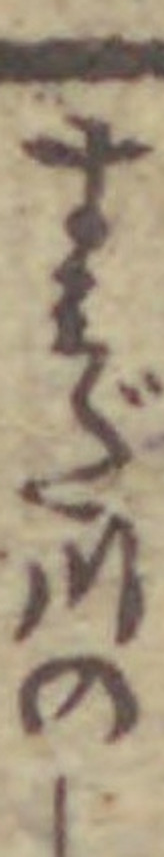すみだ川の
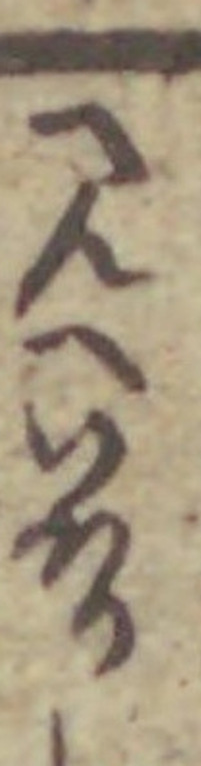へんへいほり
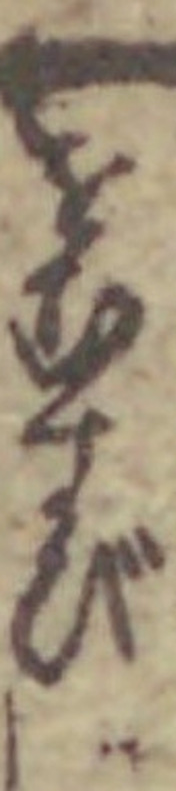をむすび
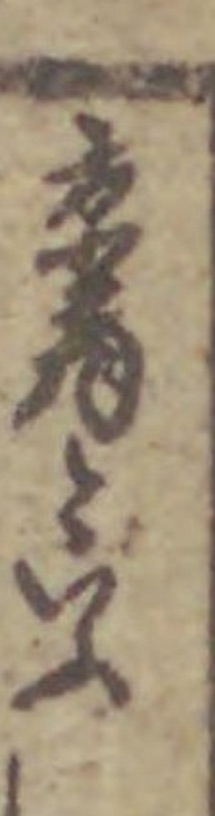京扇といふ
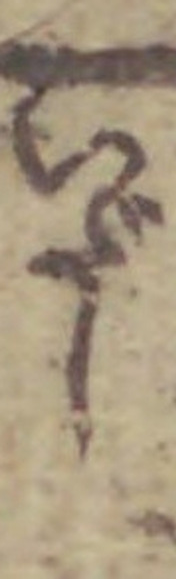いだし
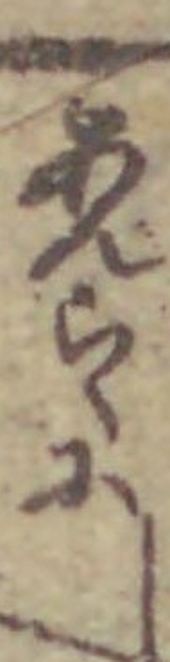あんらくに
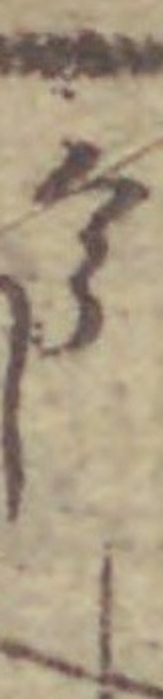くらし
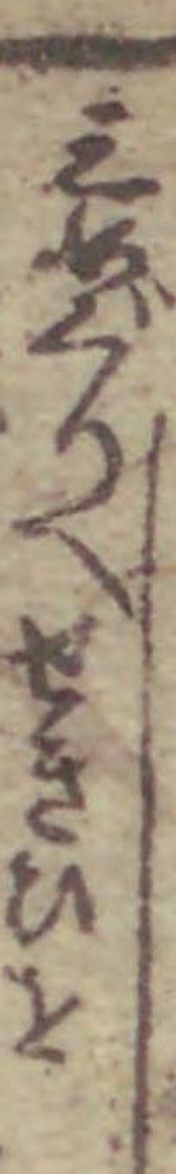三めぐりへせきひを
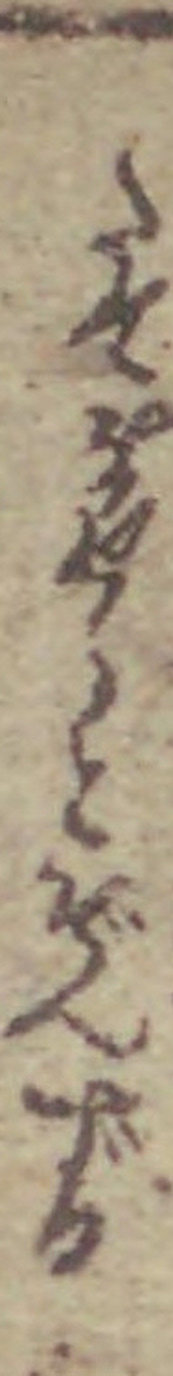たてませうとぞんずる
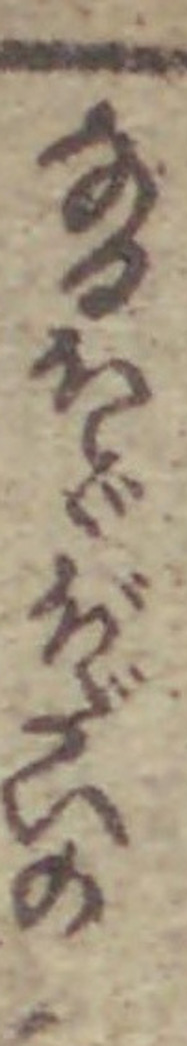なるほどぼだいの
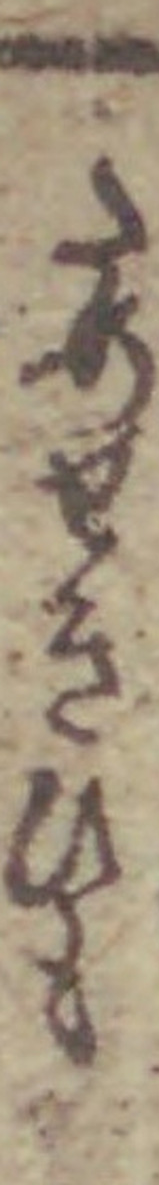ためせきひも
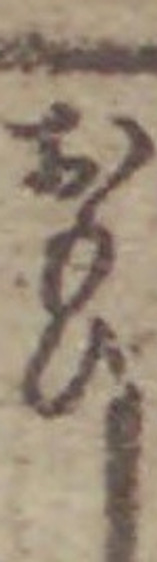おもひ
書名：大通其面影 2巻
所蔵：国立国会図書館 National Diet Library, JAPAN
